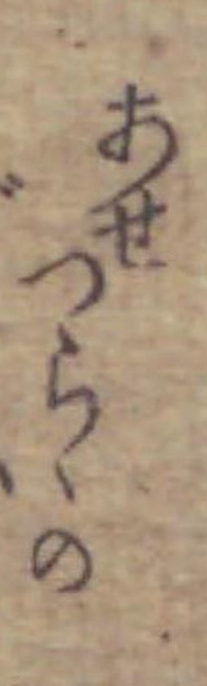つらゝの
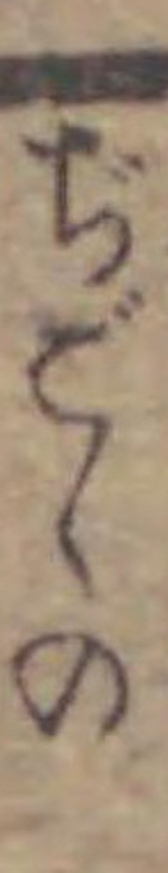ぢごくの
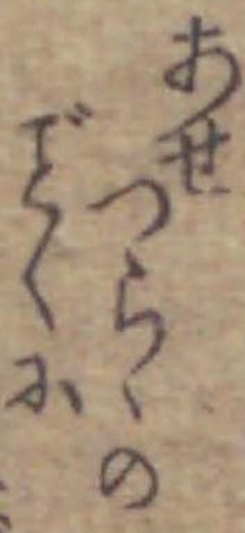ごとくに
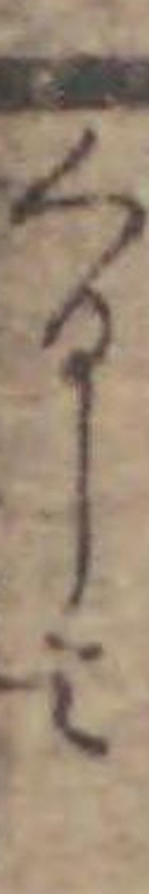くるしみ
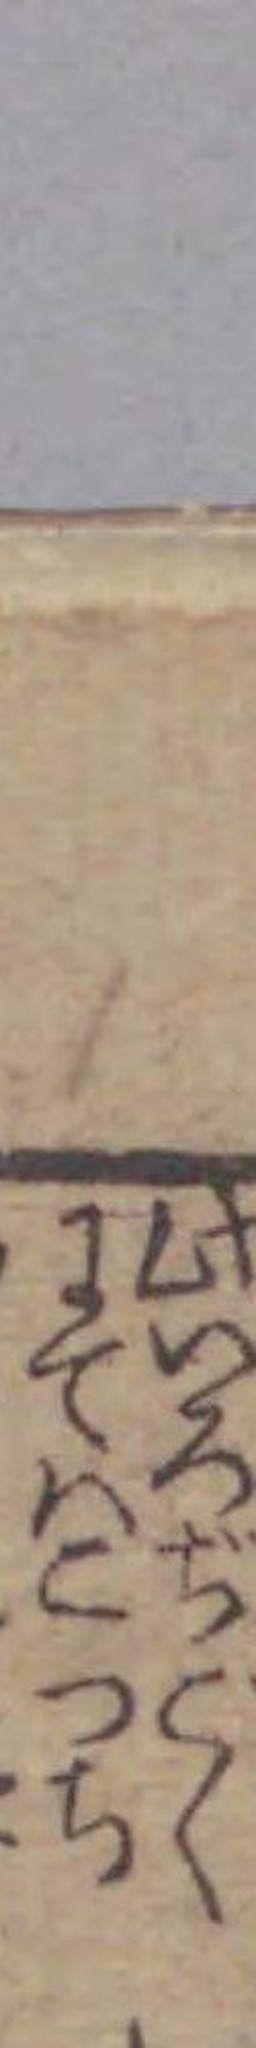にてはこつち
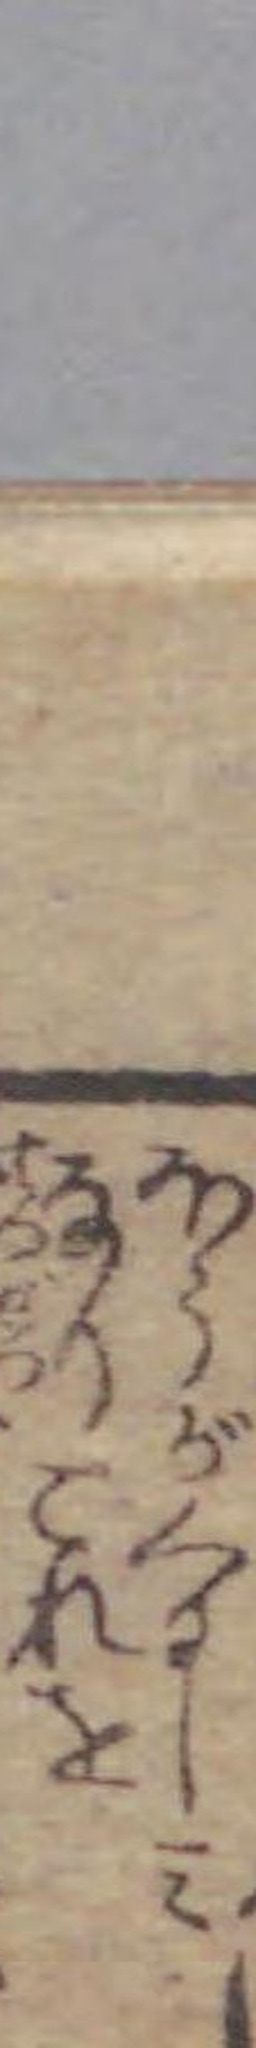なりこれを
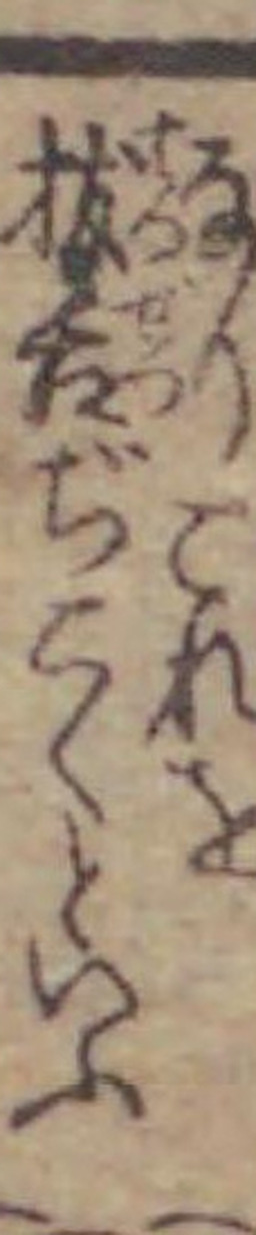抜舌ぢごくといふ
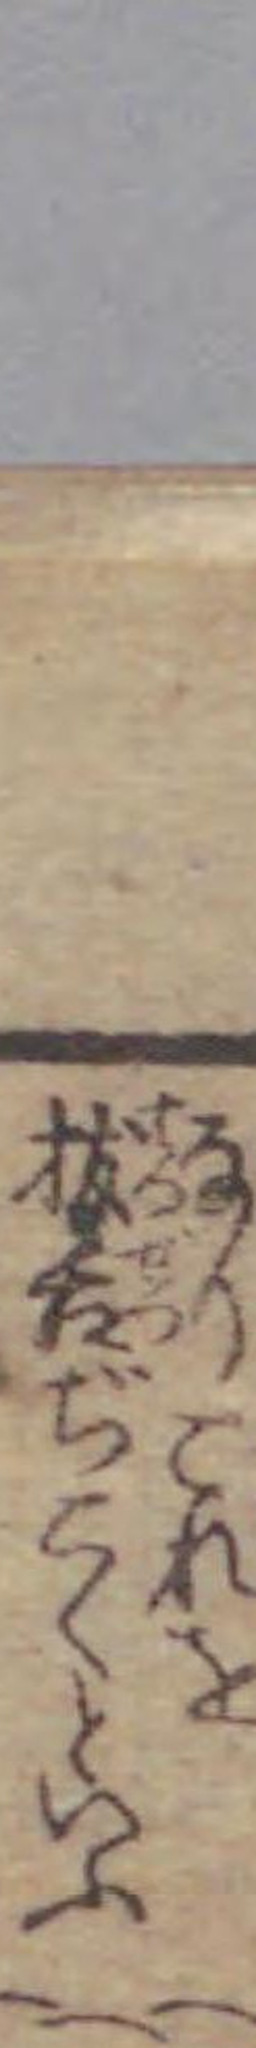抜舌ぢごくといふ
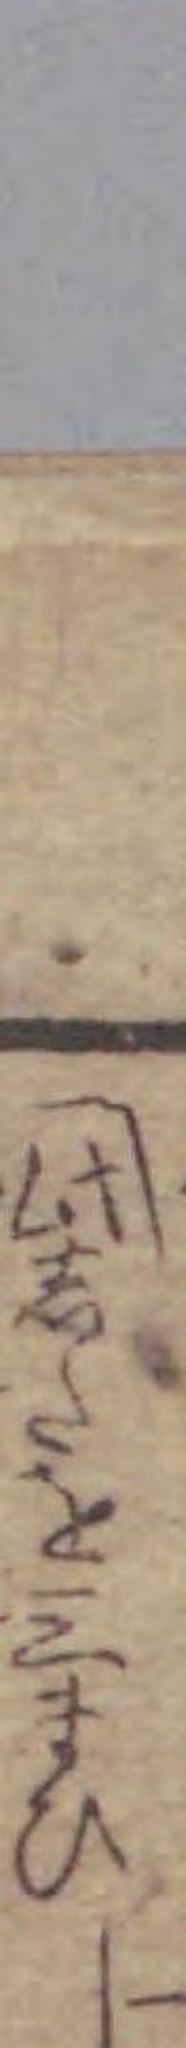「此したを三まひ
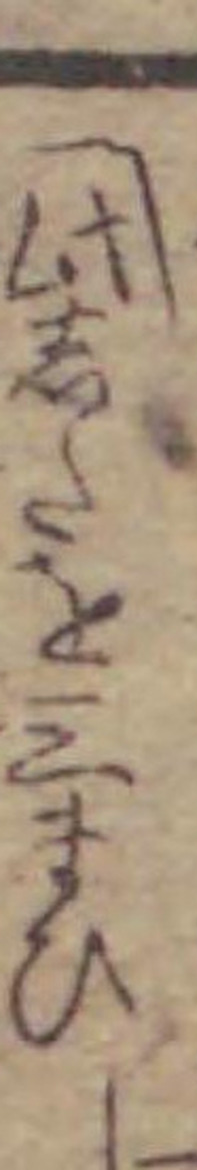「此したを三まひ
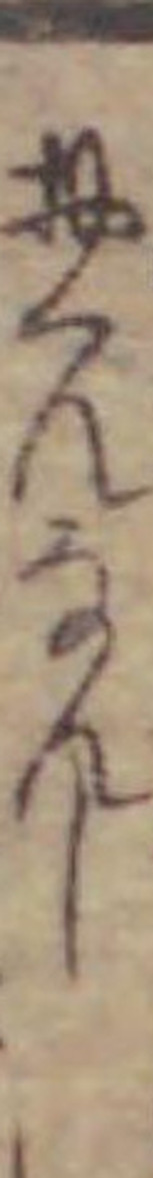おくんなんし
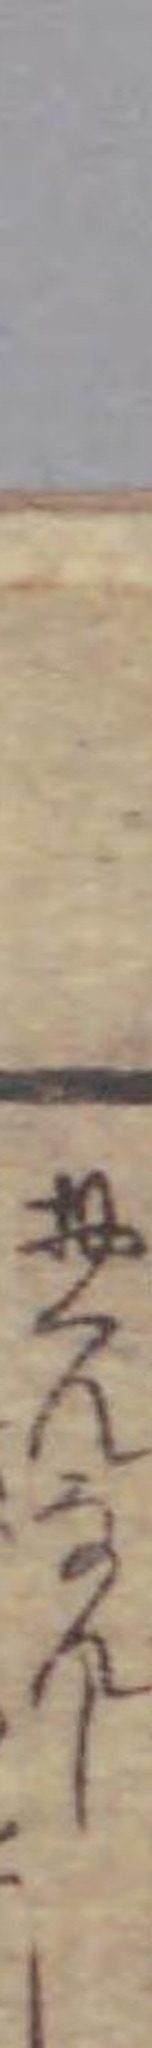おくんなんし
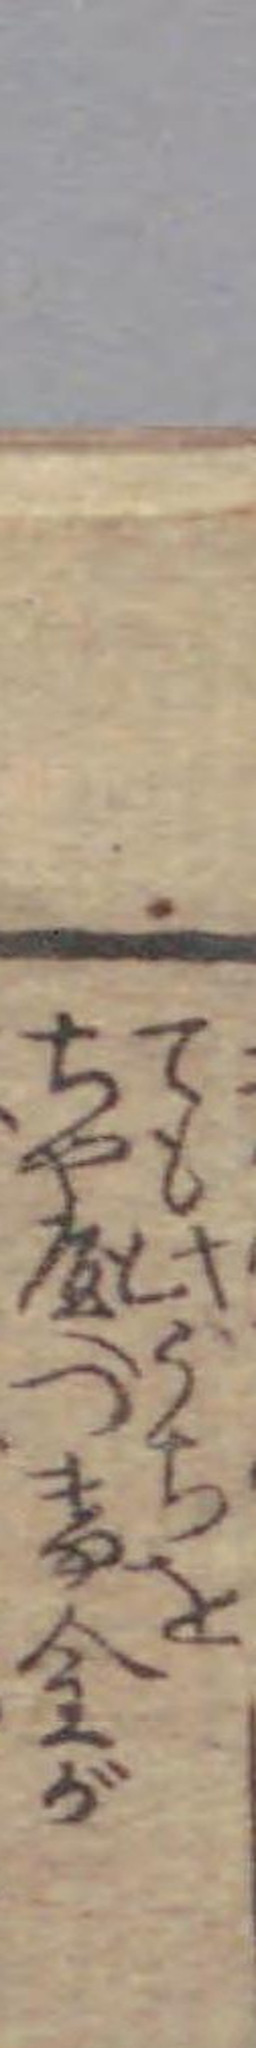ちや屋へつけ金が
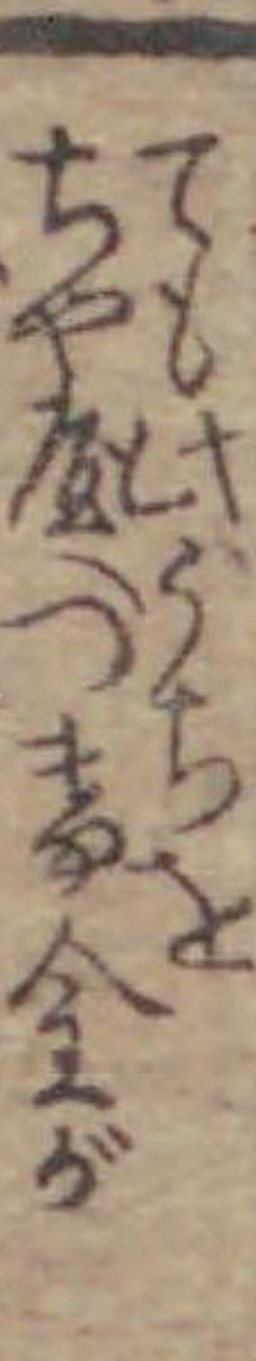ちや屋へつけ金が
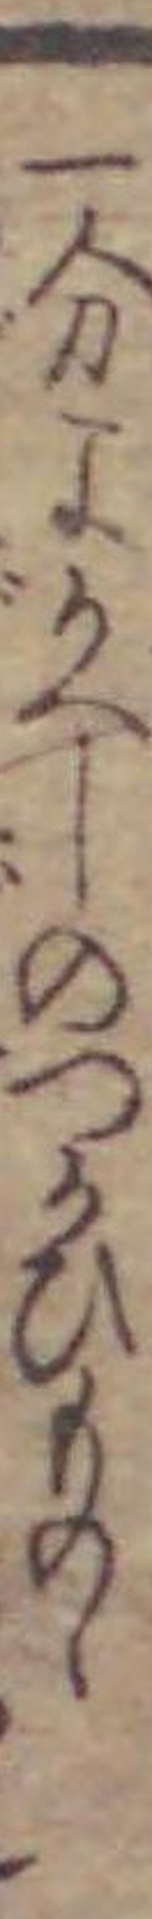一分にかへしのつかひものゝ
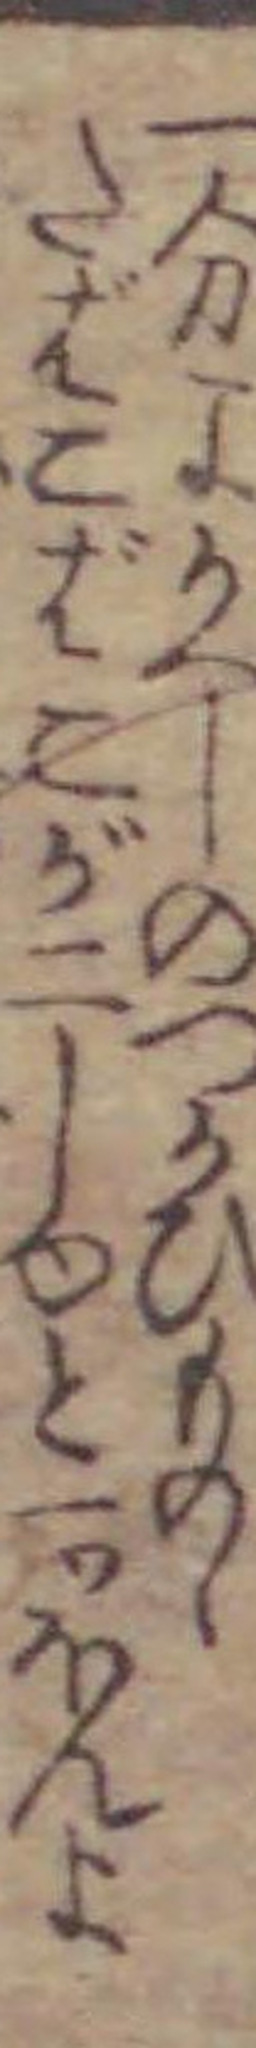たばこばこが二しゆと一ほんよ
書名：九替十年色地獄 : 3巻
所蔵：国立国会図書館 National Diet Library, JAPAN
